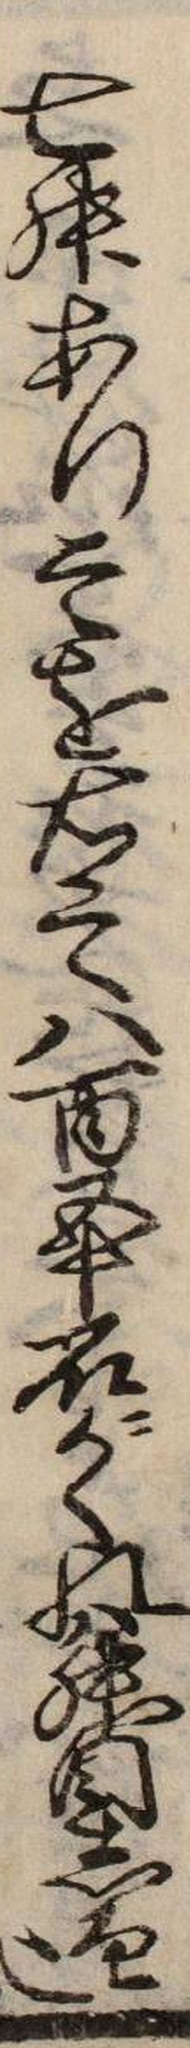七舛あり是を右の八百五十石にかくれは残目しる也
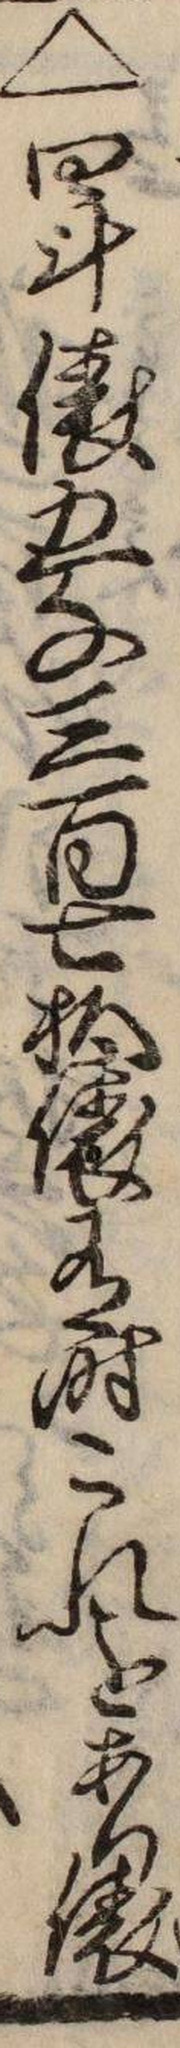△四斗俵五千三百七拾俵有時これをあり俵
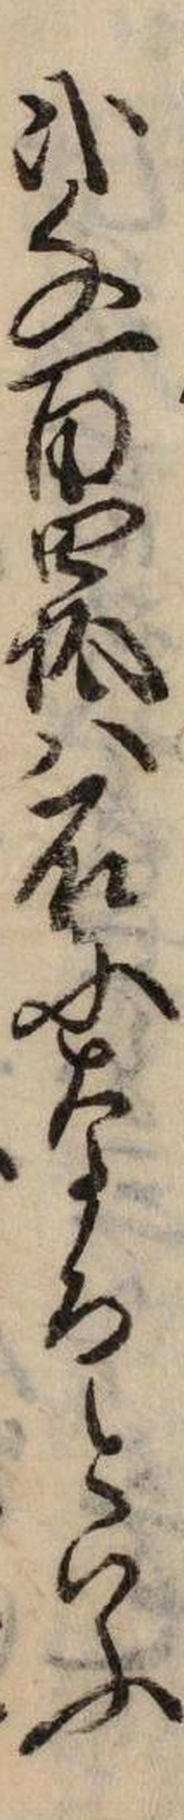弐千百四拾八石になるといふ
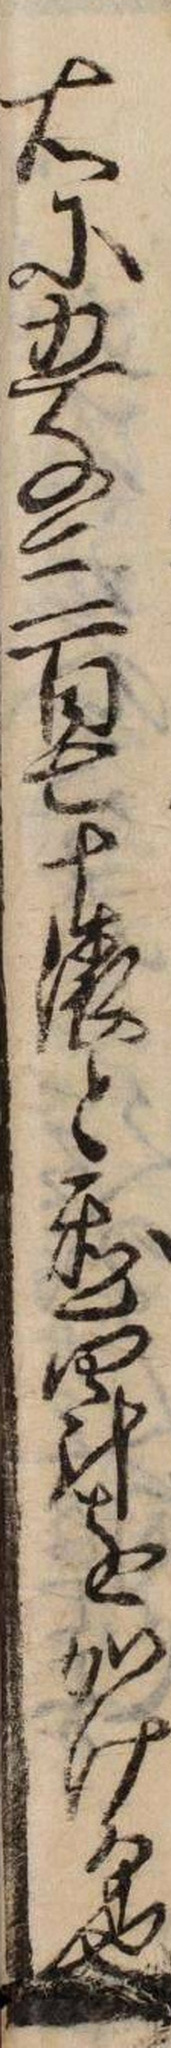右に五千三百七十俵と置四斗をかける也
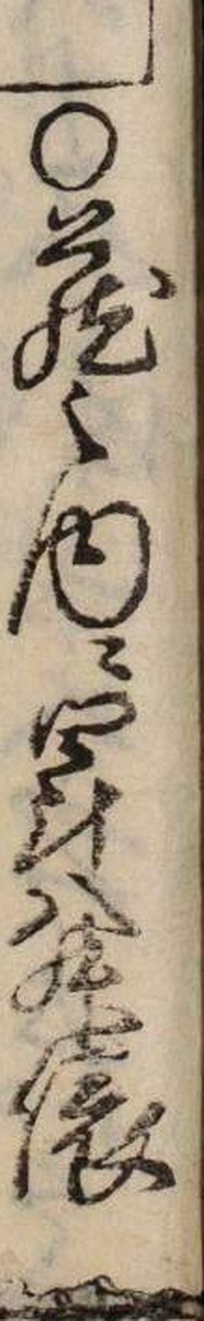○蔵之内に四斗八舛俵
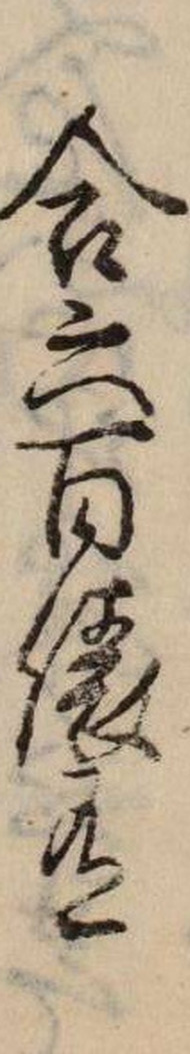合六百俵有
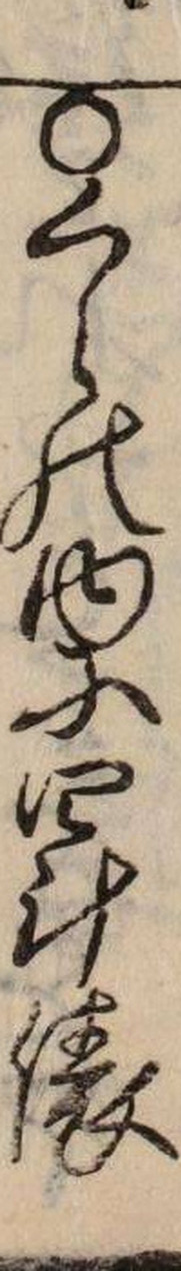○くらの内に四斗俵
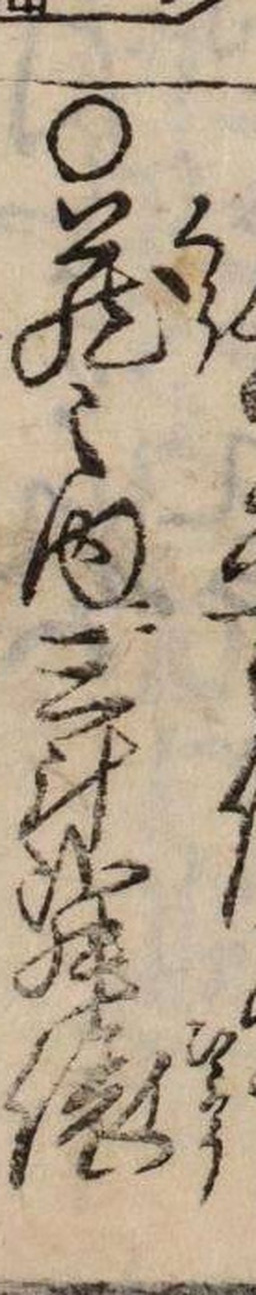○蔵之内に三斗弐舛俵
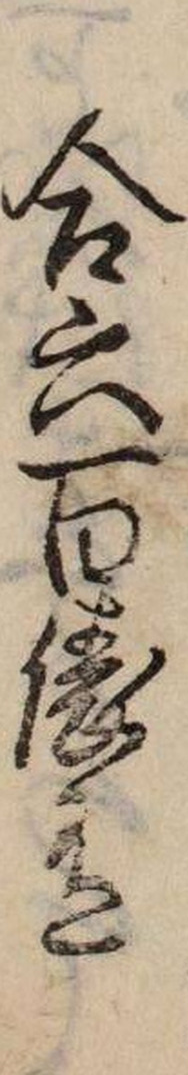合六百俵有
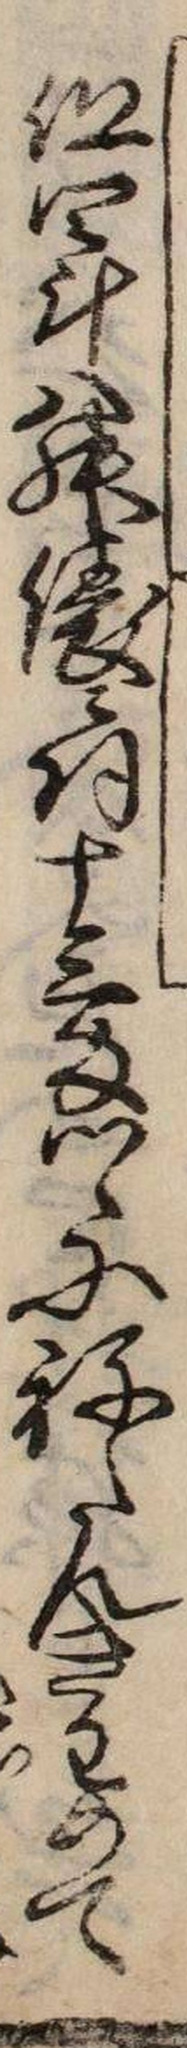但四斗八舛俵に付十三匁つゝにねたんきわめて
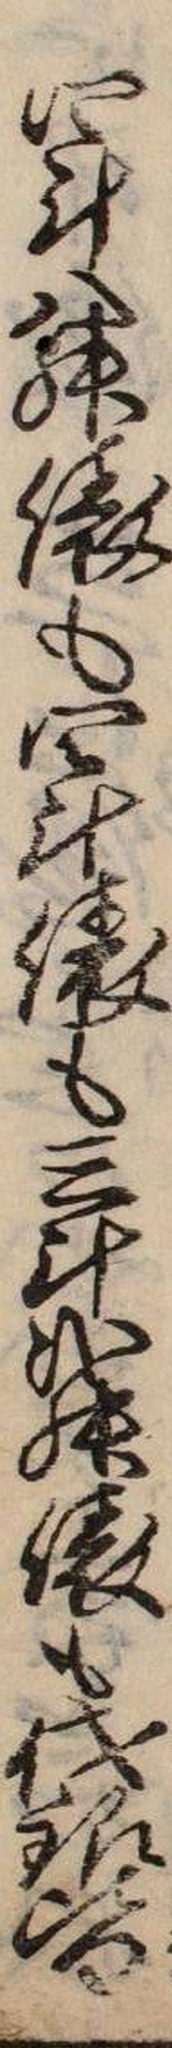四斗八舛俵も四斗俵も三斗弐舛俵も代銀皆
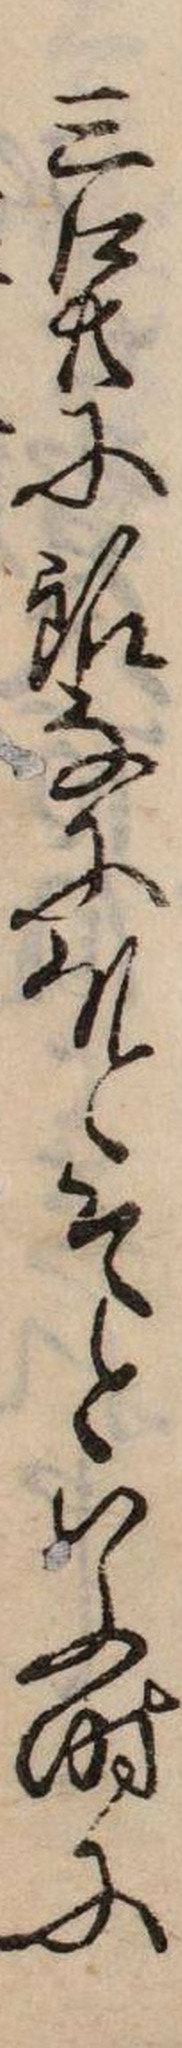三口廿に銀なにほとそといふ時に

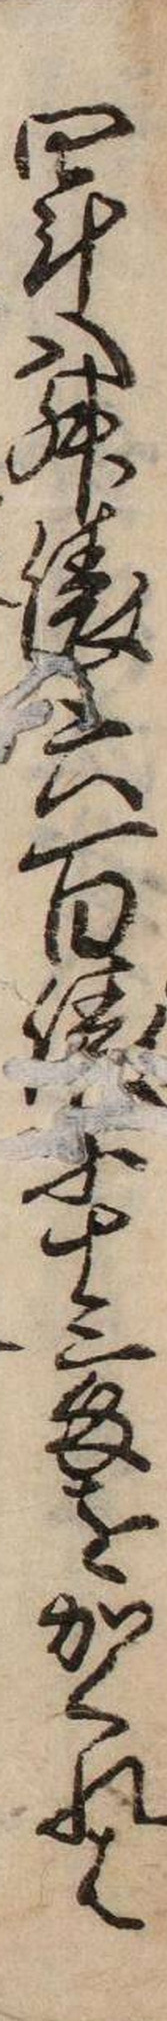四斗八舛俵六百俵に十三匁をかくれは
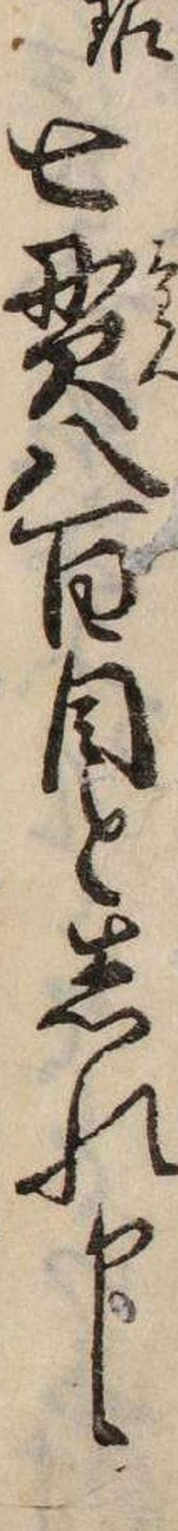銀七貫八百目としれ申候
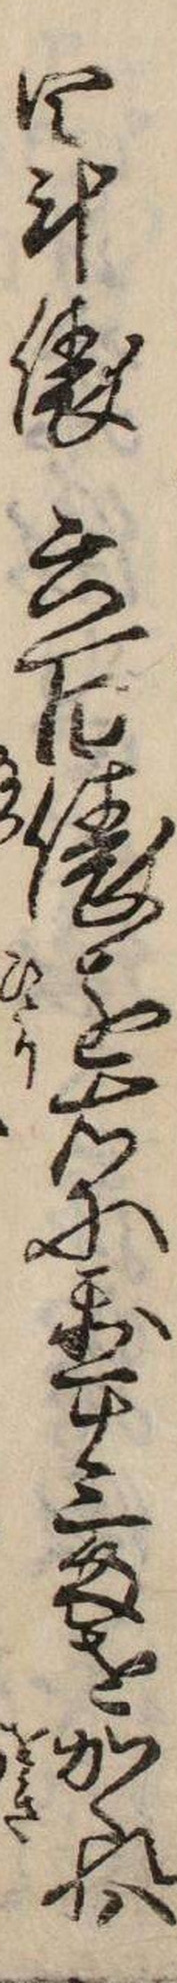四斗俵六百俵を右に置十三匁をかくれは
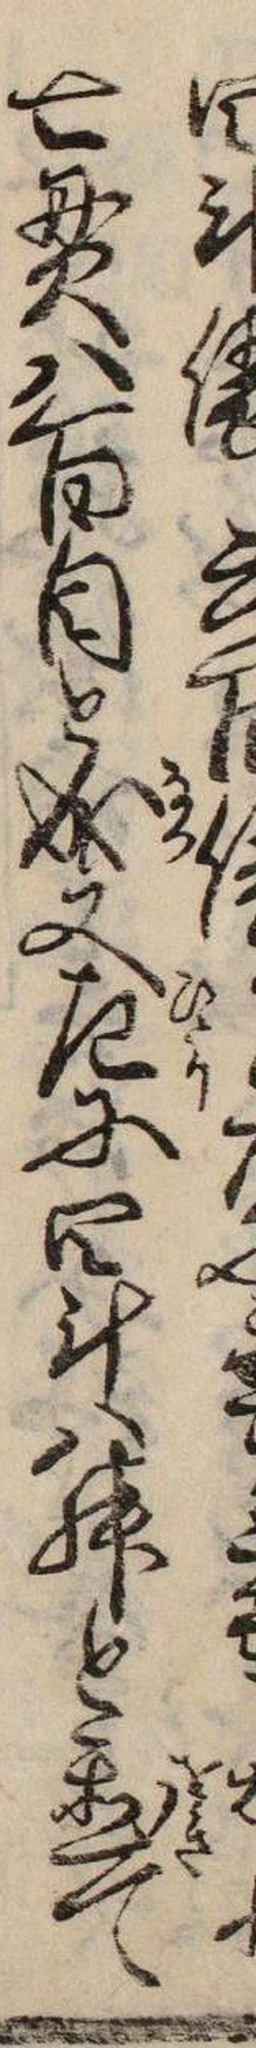七貫八百目と成又左に四斗八舛と置て
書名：塵劫記（寛永11年自跋、京都府立京都学・歴彩館追貴8）
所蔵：京都府立京都学・歴彩館 国文学研究資料館
